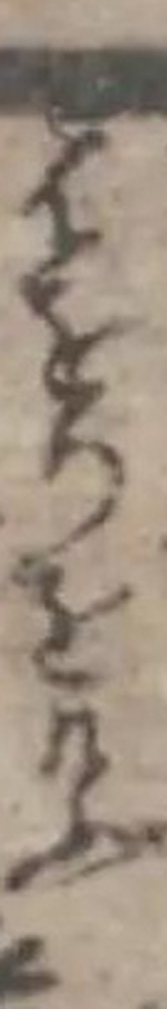はをりをけふ
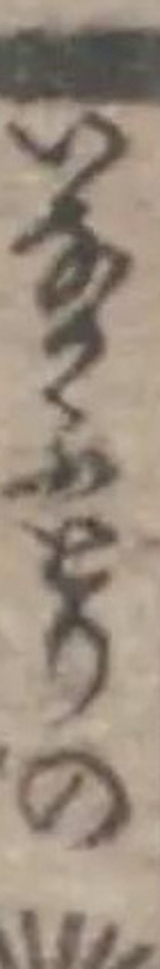いなかふとりの
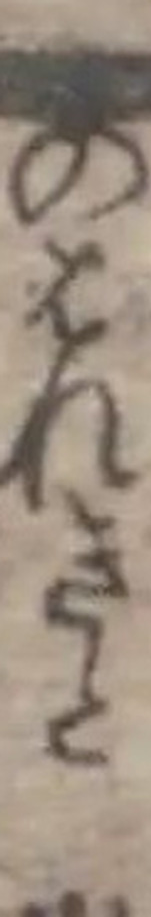のはれきと
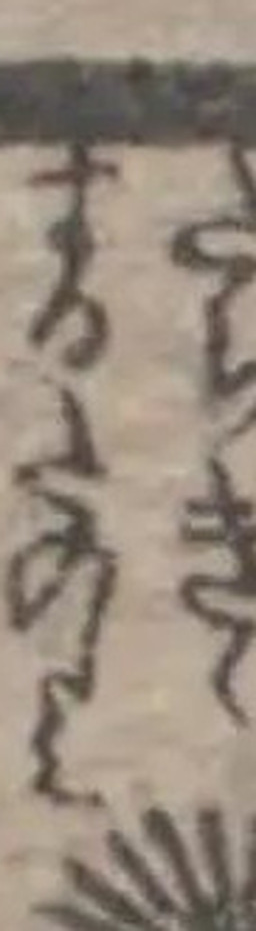するたのしみ
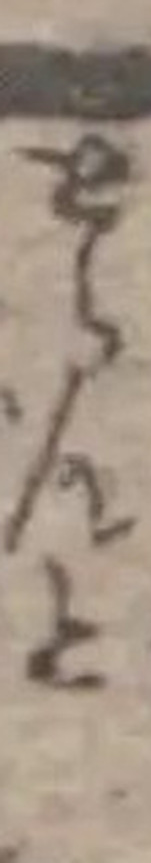とらんと
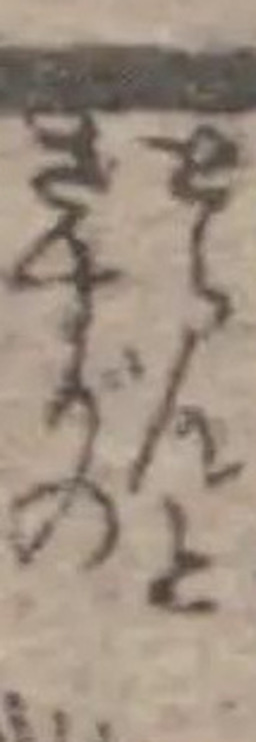さすがの
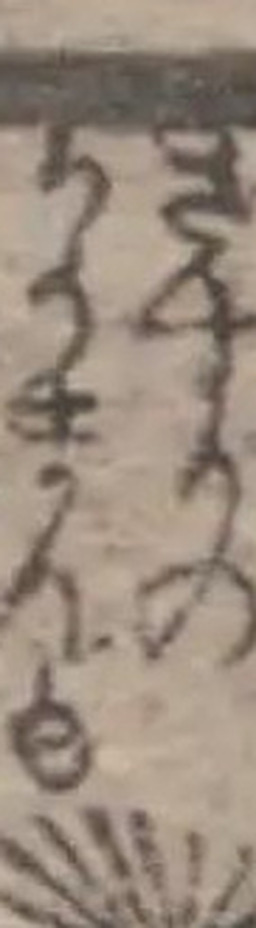かうまんも
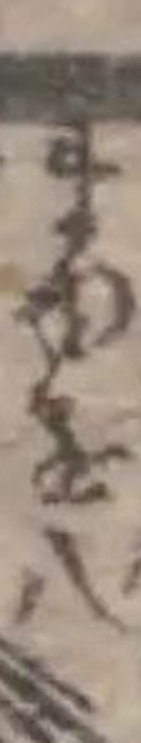まゆを八
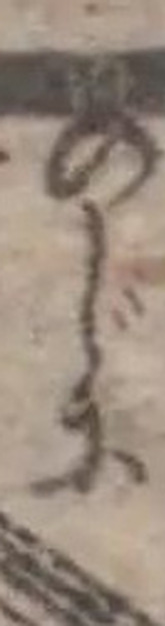のじに
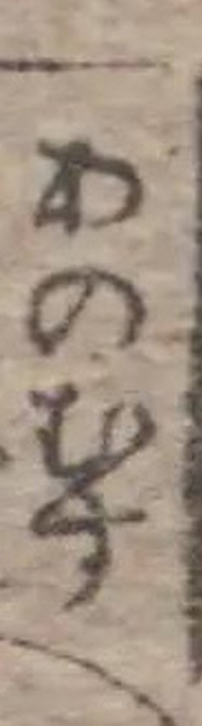あのむす
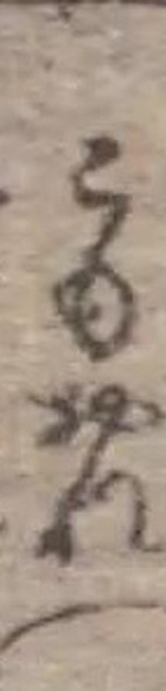こもおれ
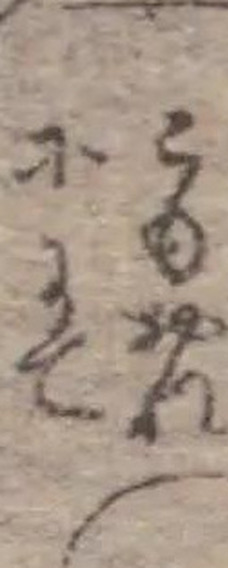ににて
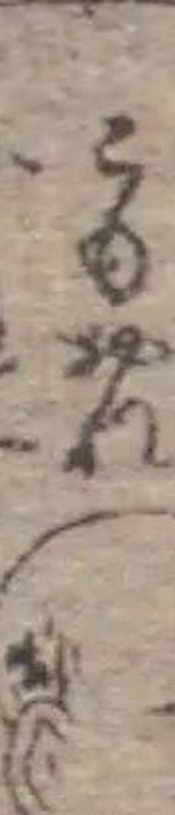こもおれ
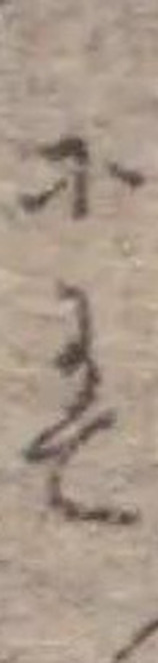ににて
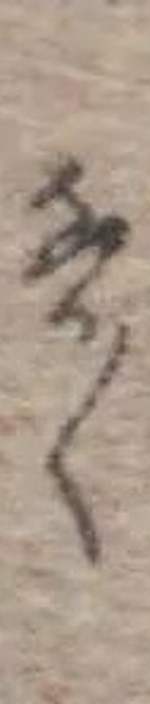なか〳〵

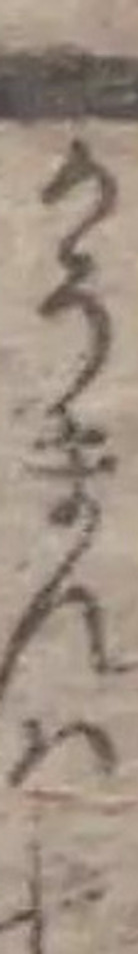かうまんは
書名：富多高慢噺 3巻
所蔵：国立国会図書館 National Diet Library, JAPAN
